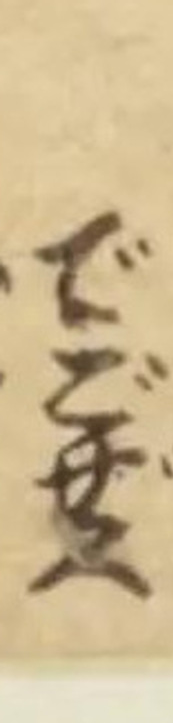でごぜへ
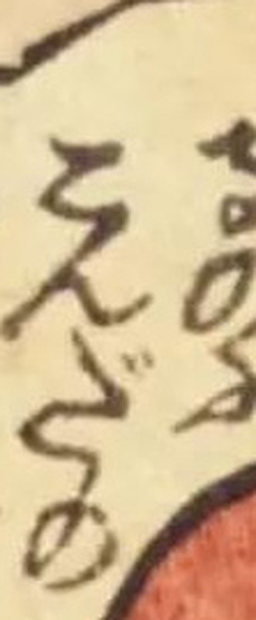こんどの
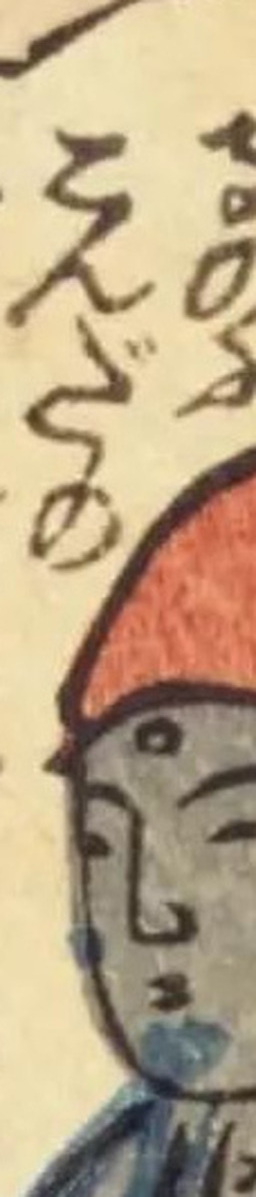こんどの
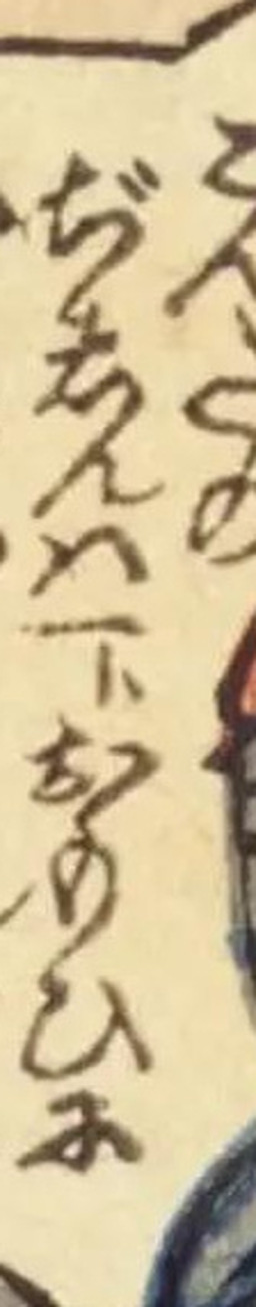ぢしんは一トおのひに
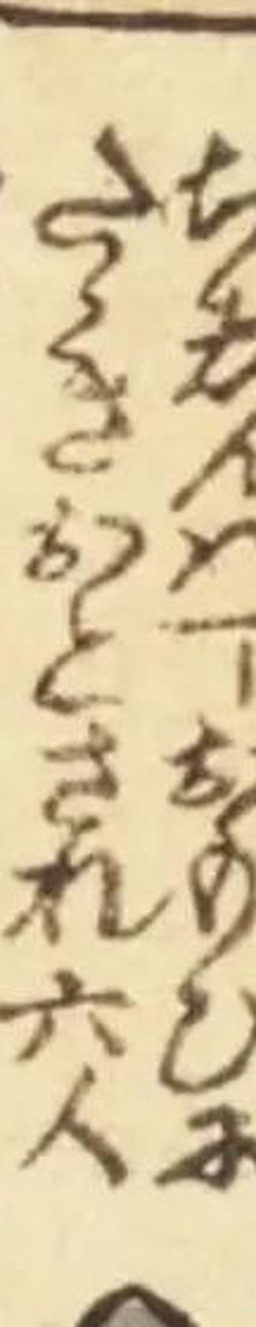たくさおとされ六人
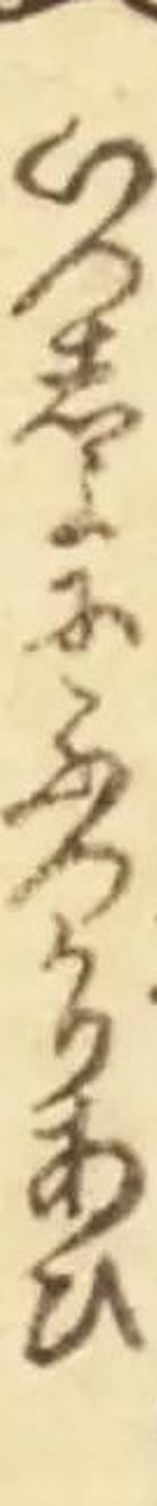いつしかにふつかりあひ
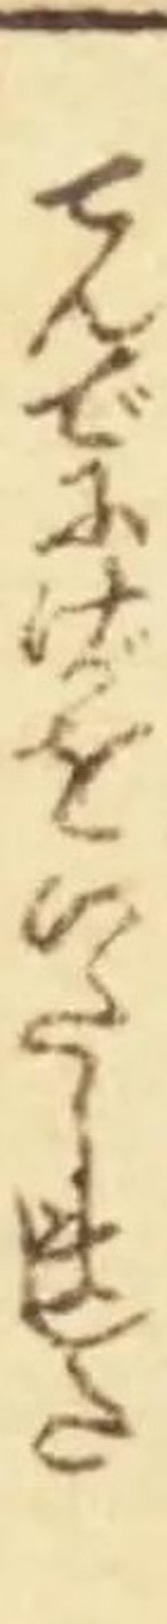てんでにけがをいたしました
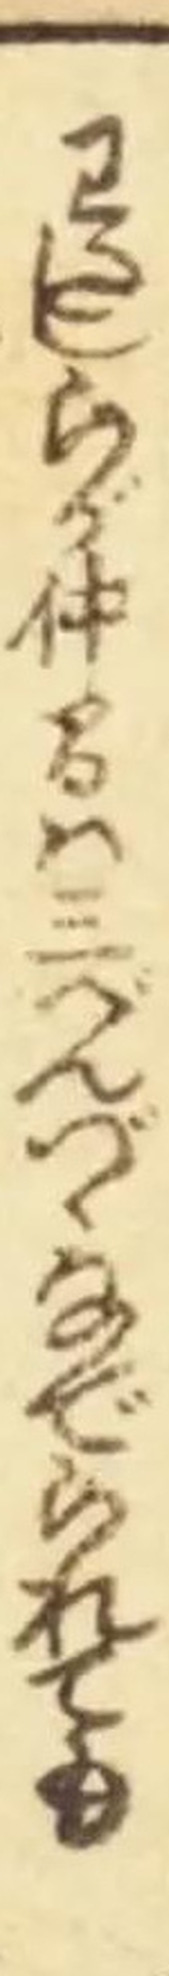わたしらが仲間は三べんづゝなでられても
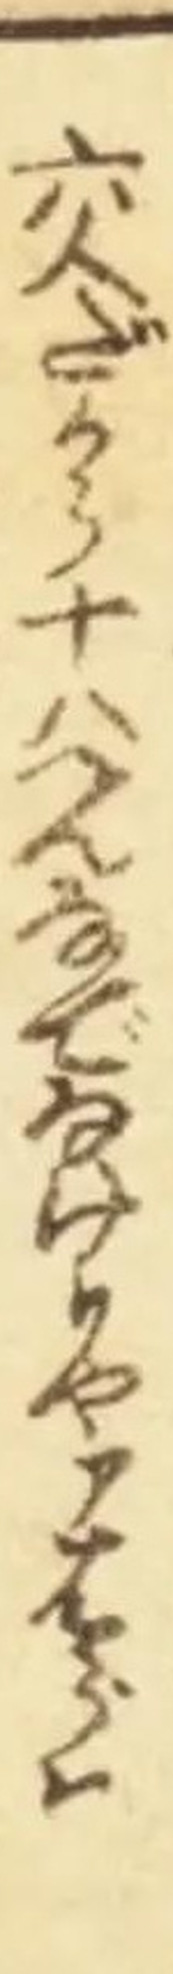六人だから十八へんなでなけりやアはらは
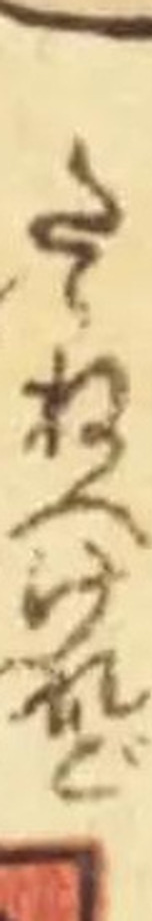たりねへけれど
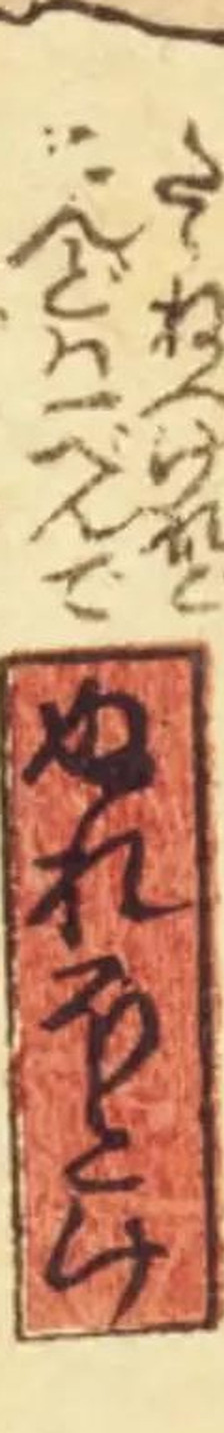こんどは一ぺんで
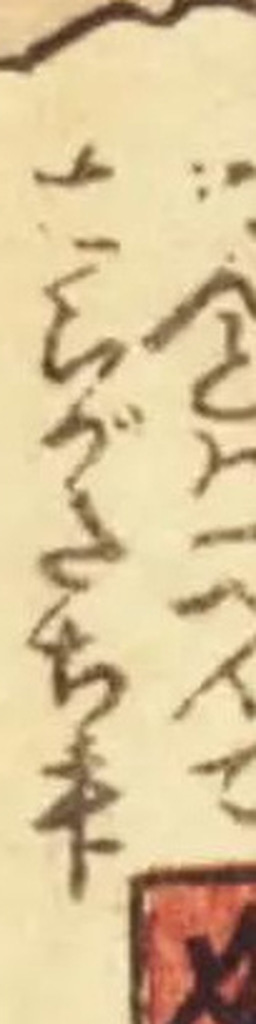はらがたち升
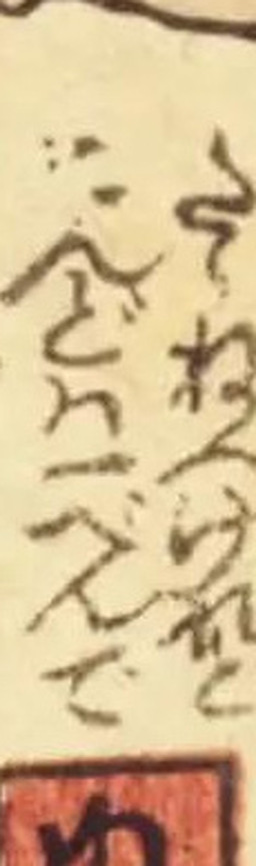こんどは一ぺんで
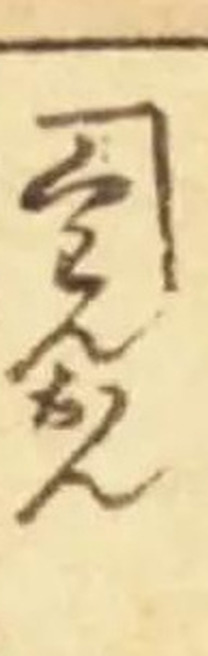「くわんおん
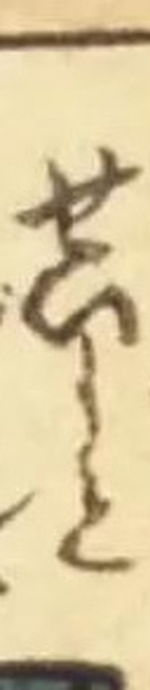せいしと
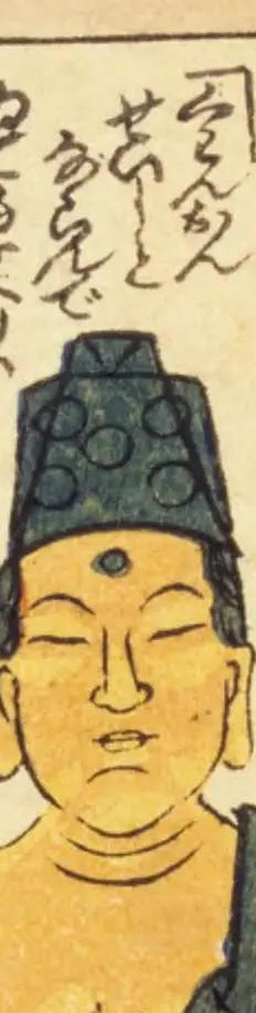ならんで
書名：安政二年十月二日地震出火後日角力
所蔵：国立国会図書館 National Diet Library, JAPAN
